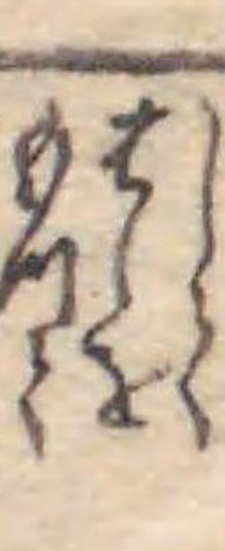もつて
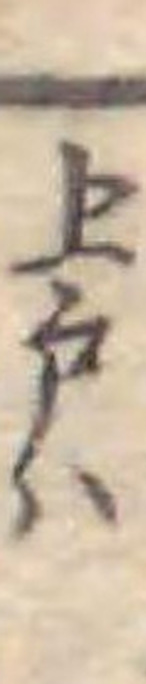上戸は
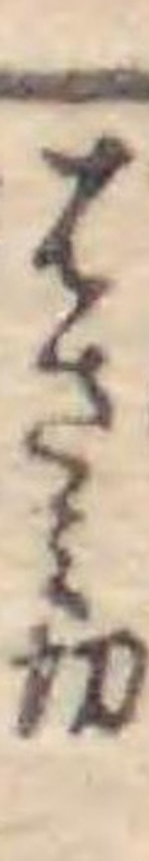はさみ切
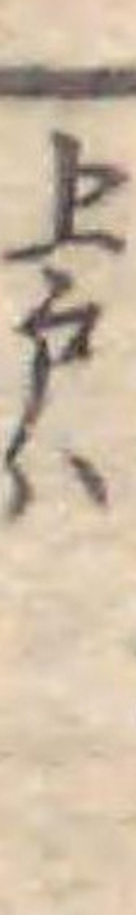上戸は
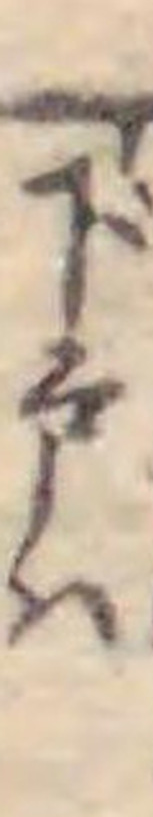下戸は
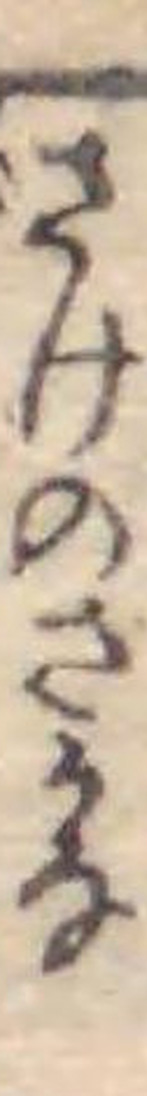さけのさかな
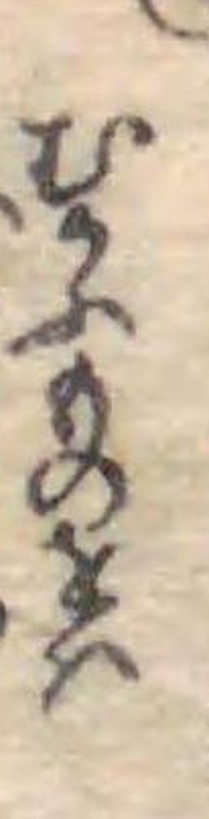むかふものをは
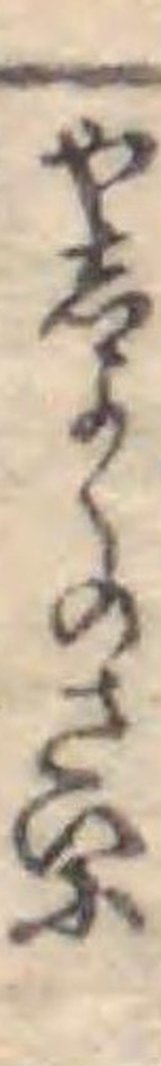やしよくのさいに
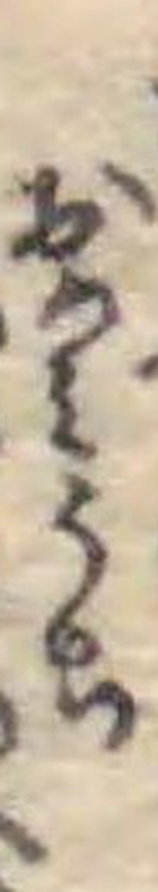おかみうち
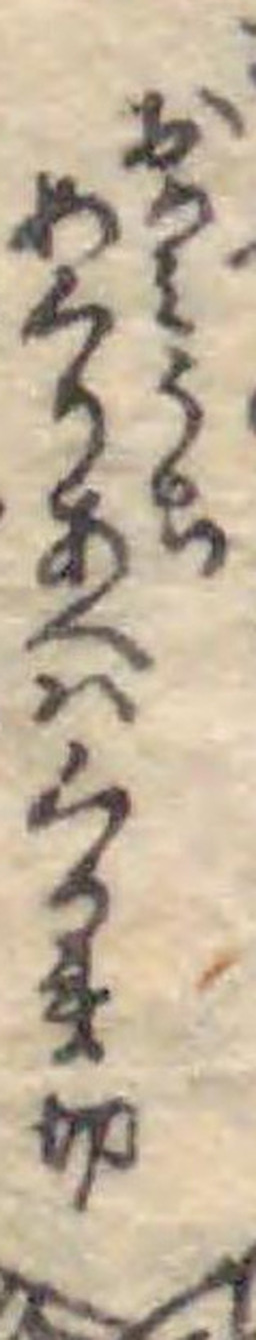めくりあへはくるま切
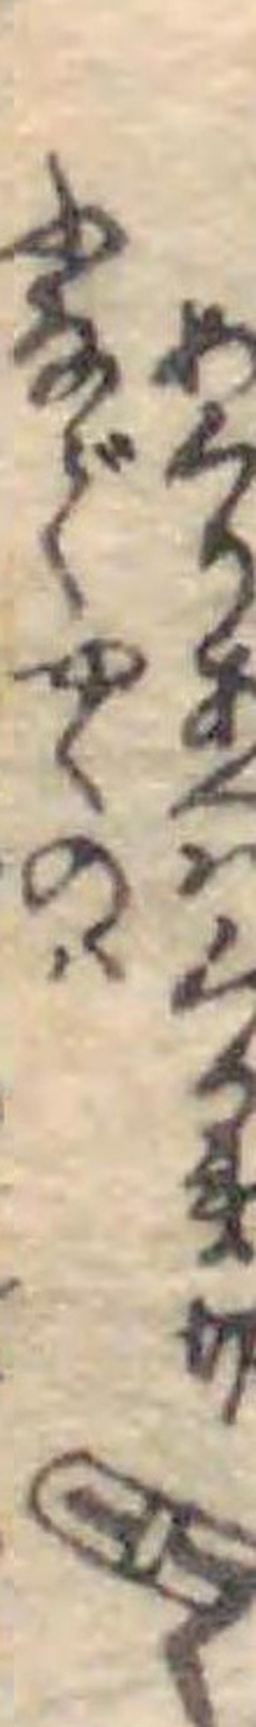ふなでやくのは
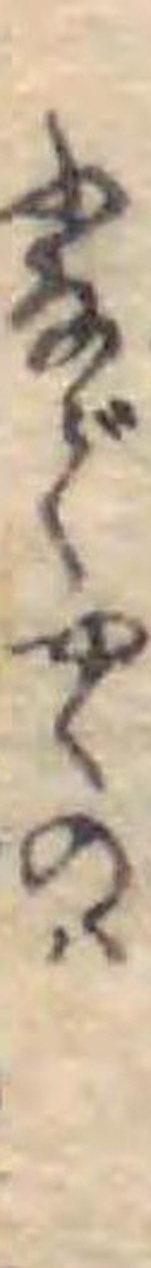ふなでやくのは
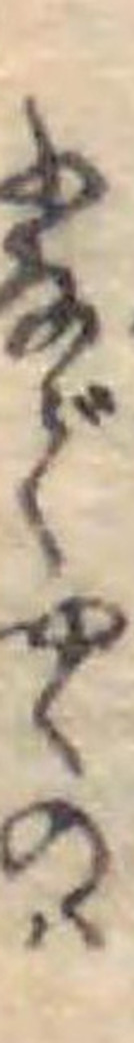ふなでやくのは
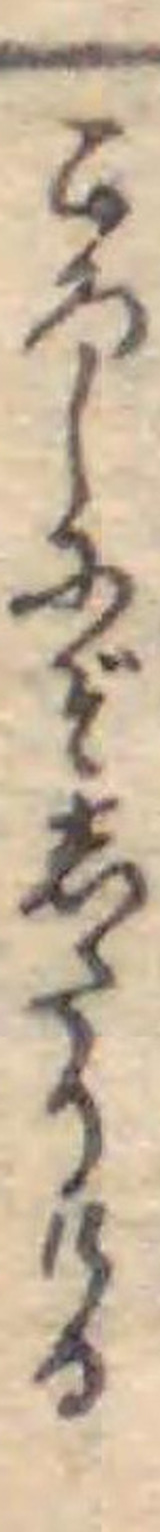ころしにぞしたりける
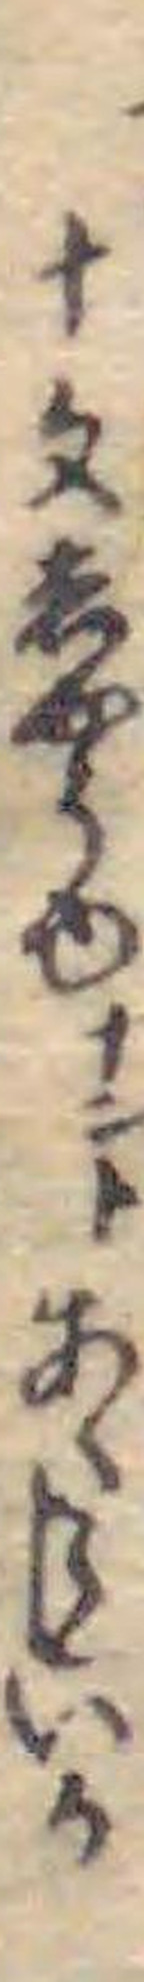十文しやうゆナントあたらしいか

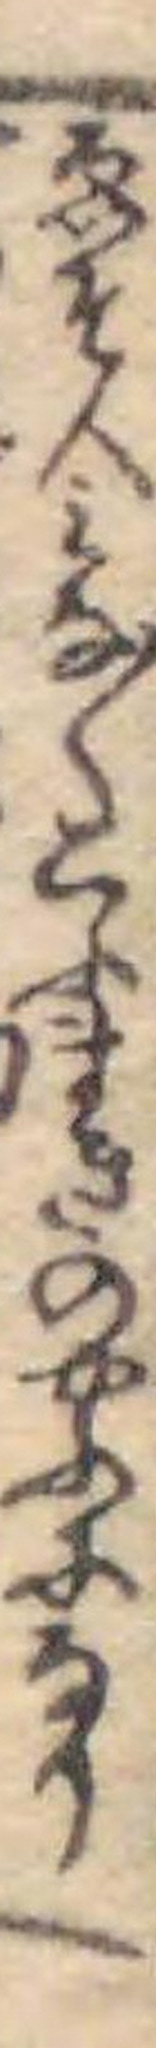ゑそ人みな〳〵こふまきのやふになり
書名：悦贔負蝦夷押領 : 3巻
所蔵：国立国会図書館 National Diet Library, JAPAN
